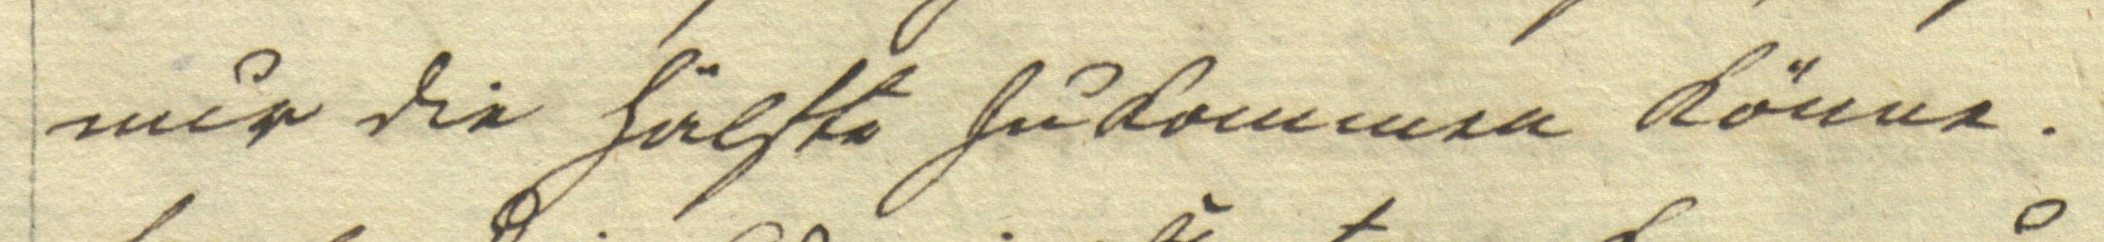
nur die Hälfte zukommen könne.
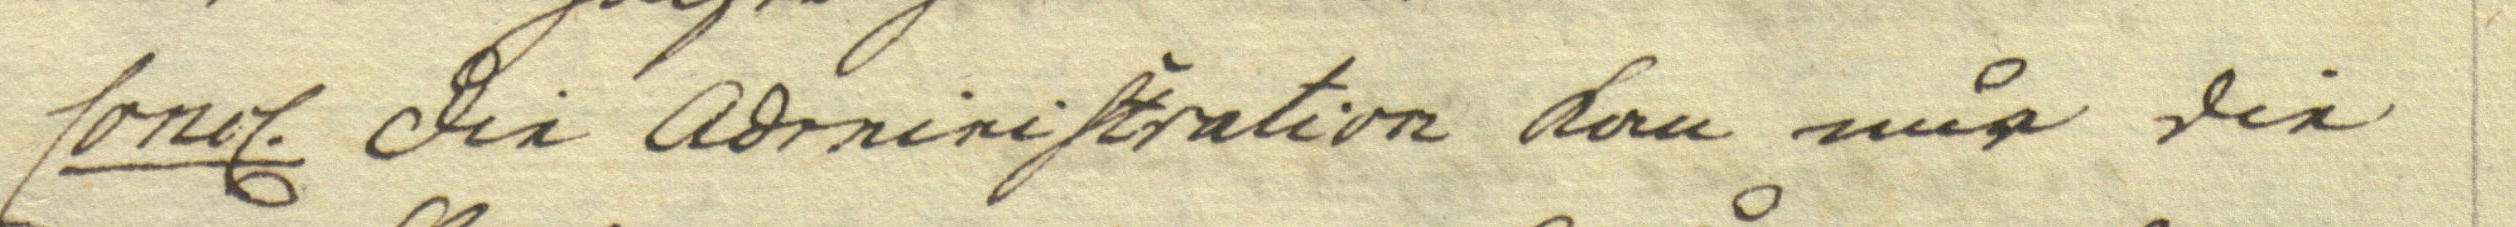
Concl. Die Administration kan nur die
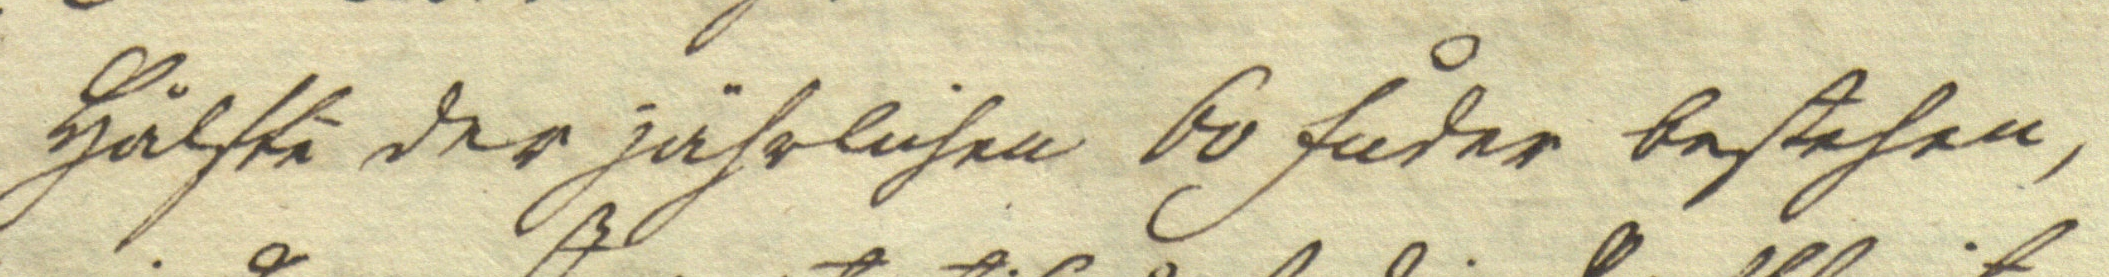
Hälfte der jährlichen 60 Fuder bestehen,
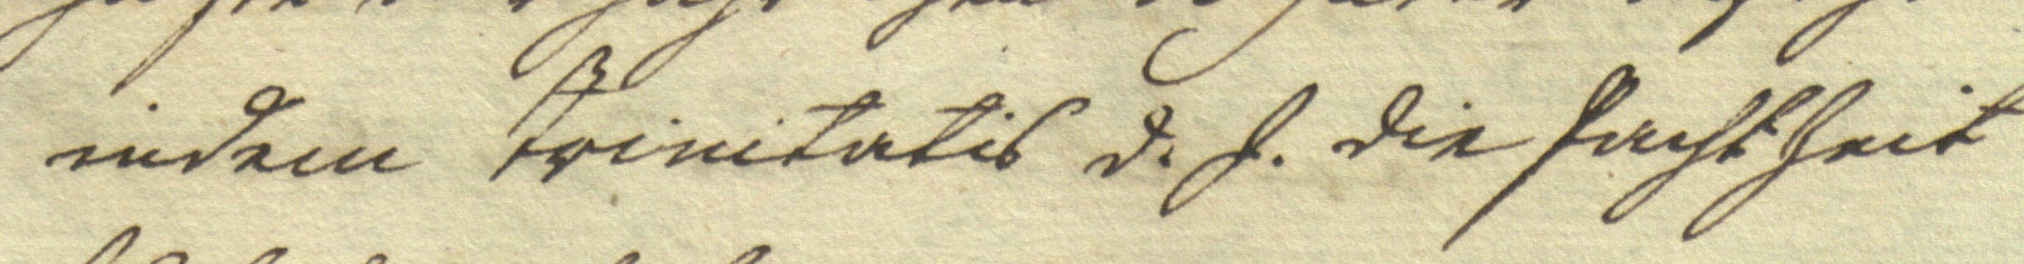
indem Trinitatis d. J. die Pachtzeit
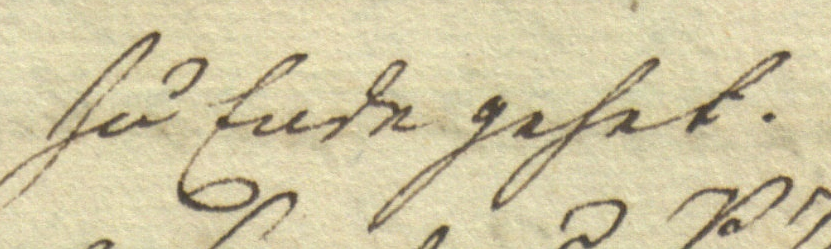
zu Ende gehabt.
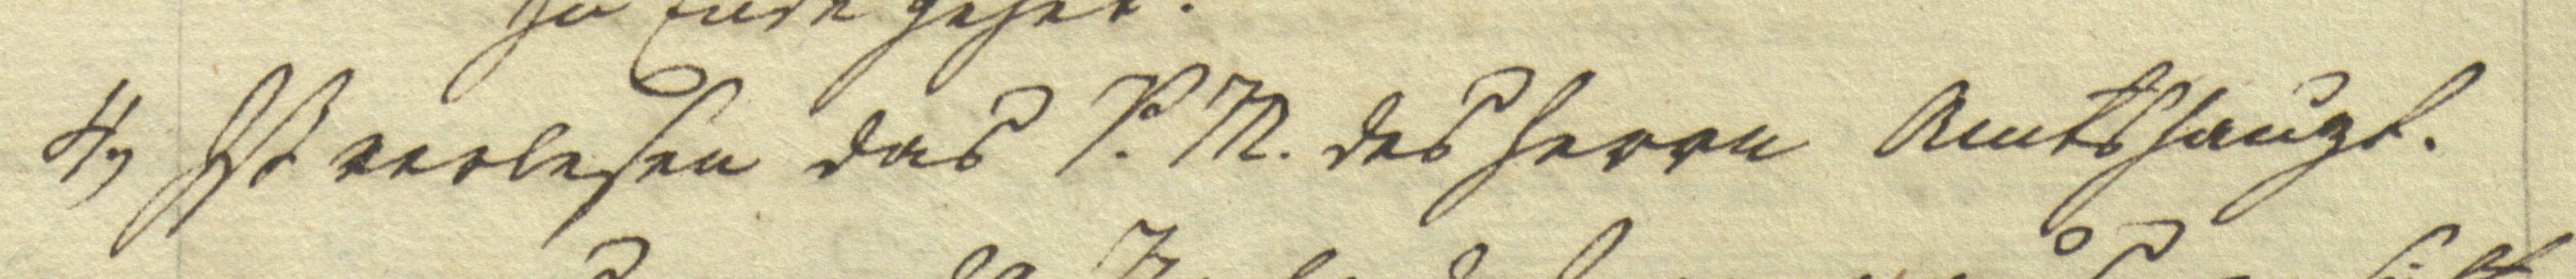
4., Ist verlesen das P. M. des Herrn Amtshaupt¬
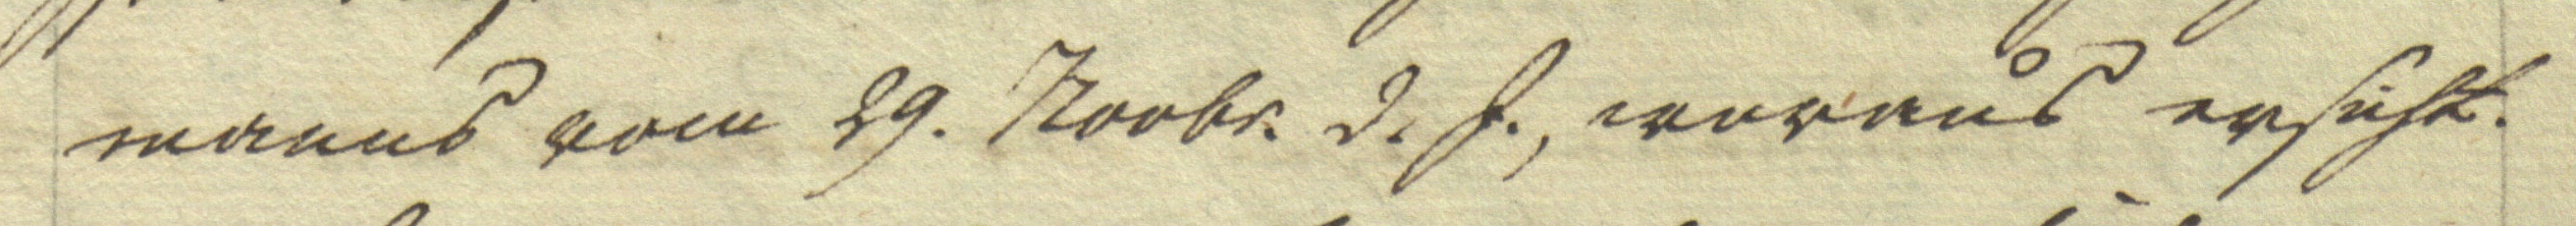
manns vom 29. Novbr. d. J., woraus ersicht¬
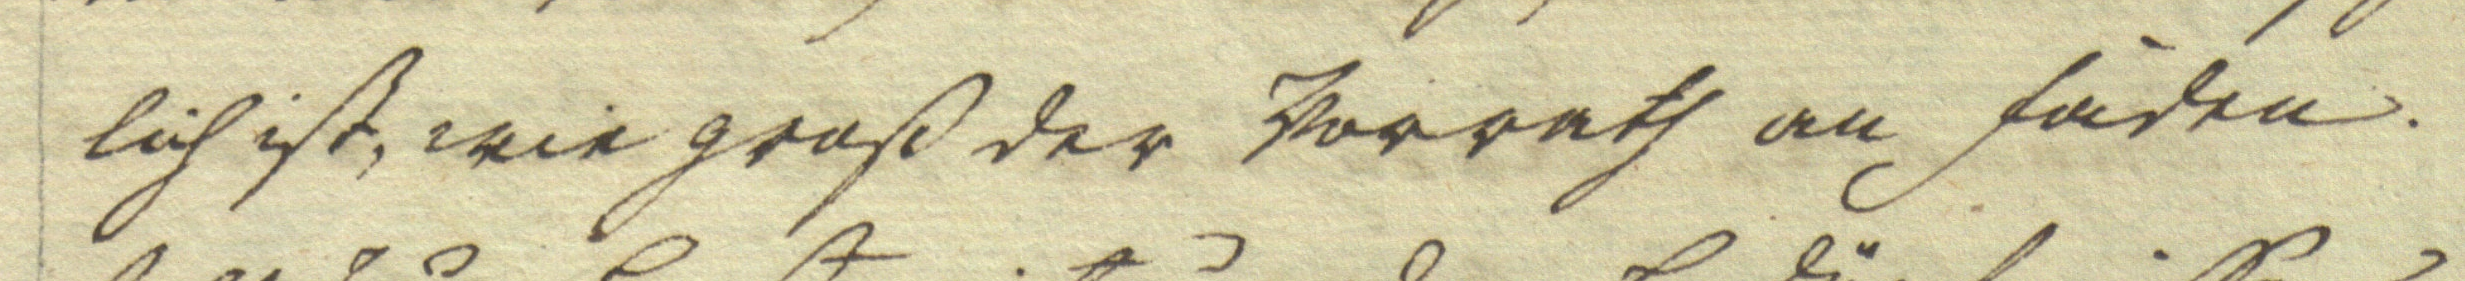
lich ist, wie groß der Vorrath an Faden¬
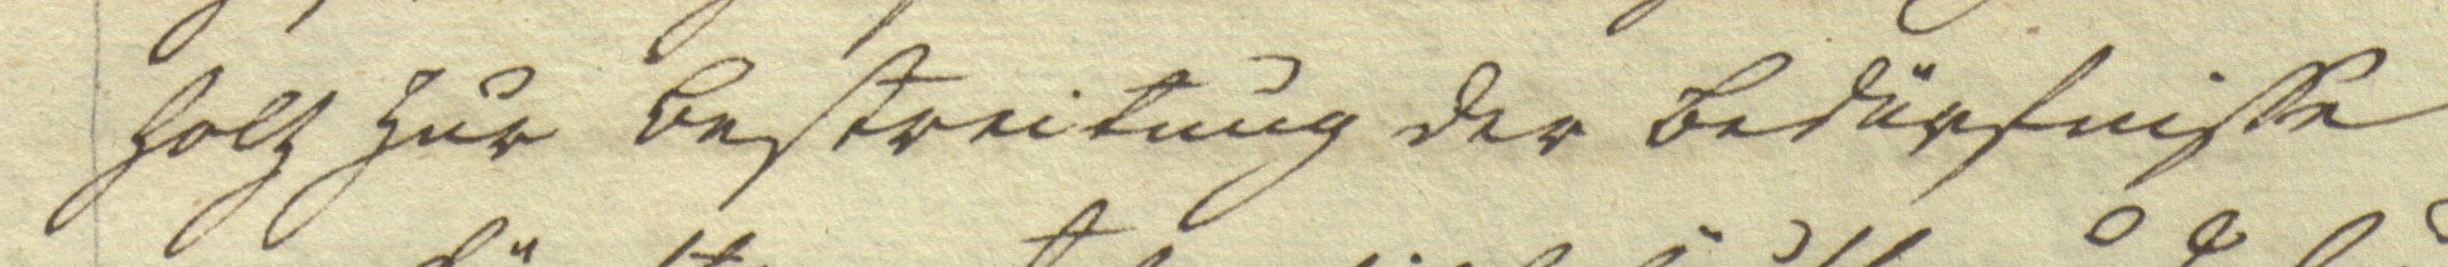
holz zur Bestreitung der Bedürfnisse
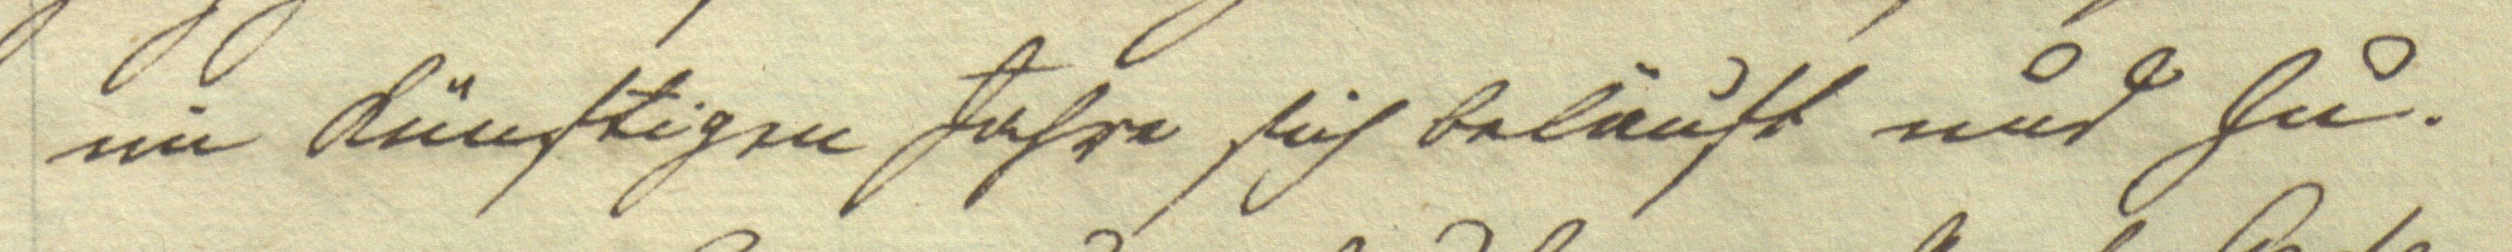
im künftigen Jahre sich beläuft und zu¬
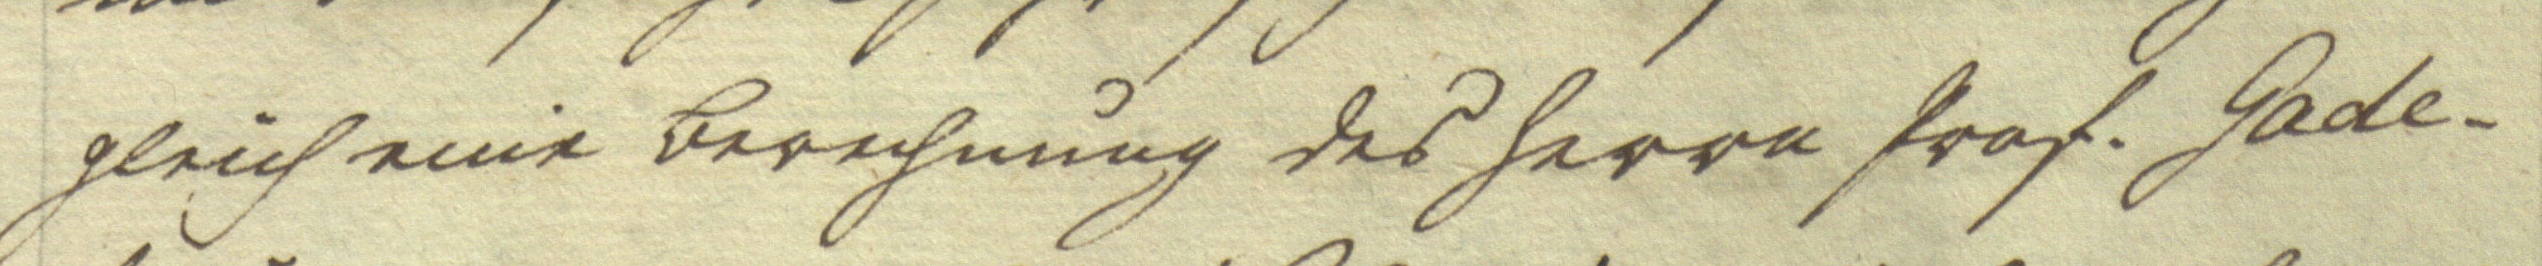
gleich eine Berechnung des Herrn Prof. Gade¬
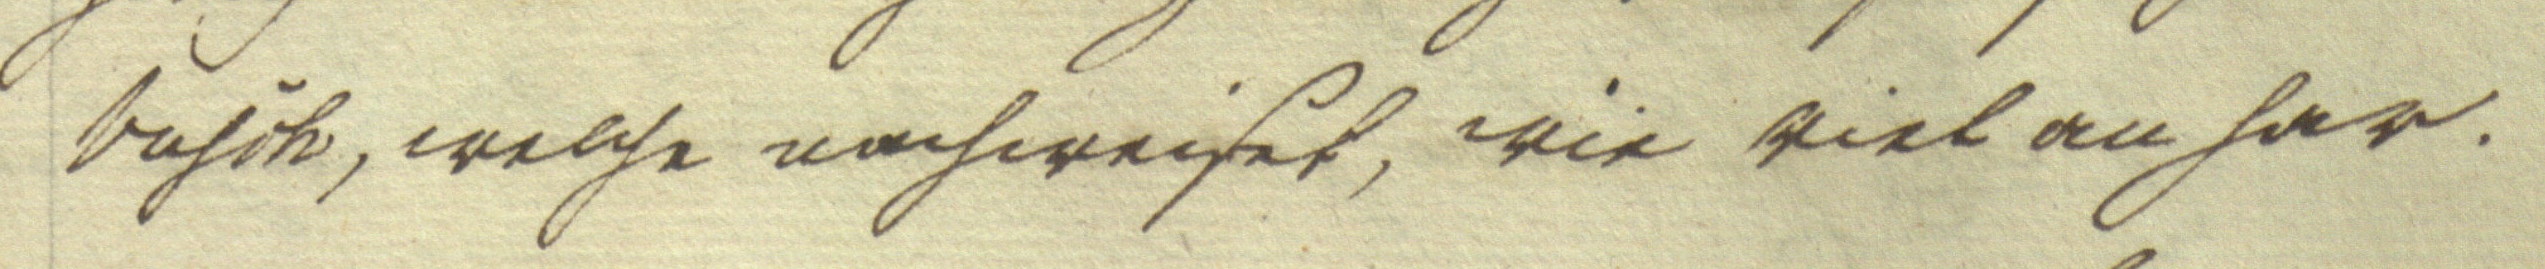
busch, welche nachweiset, wie viel an har¬
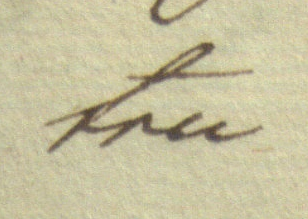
ten
